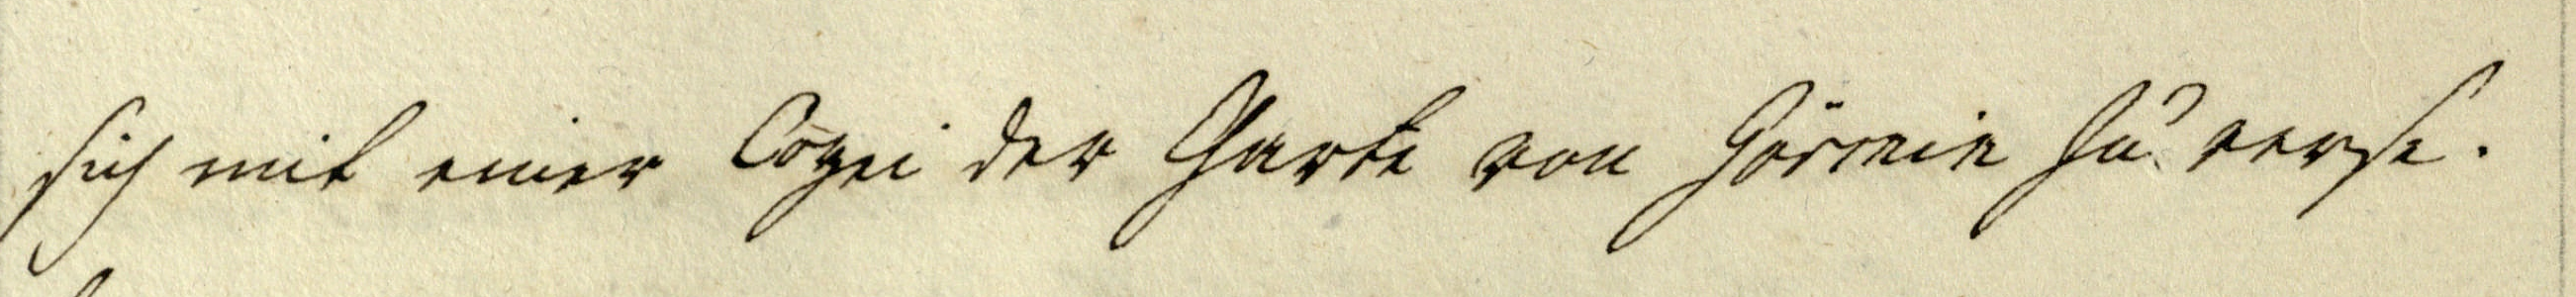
sich mit einer Copei der Charte von Görmin zu verse¬
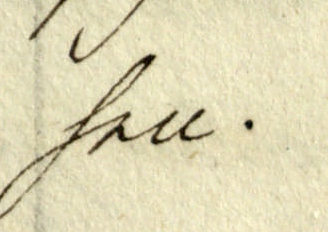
hen.
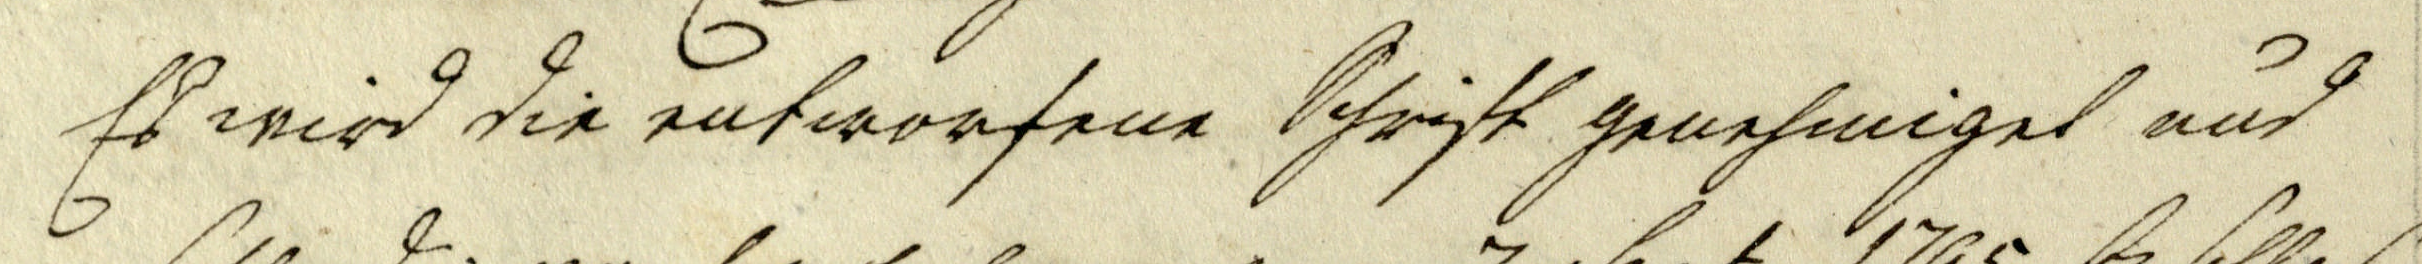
Es wird die entworfene Schrift genehmiget und
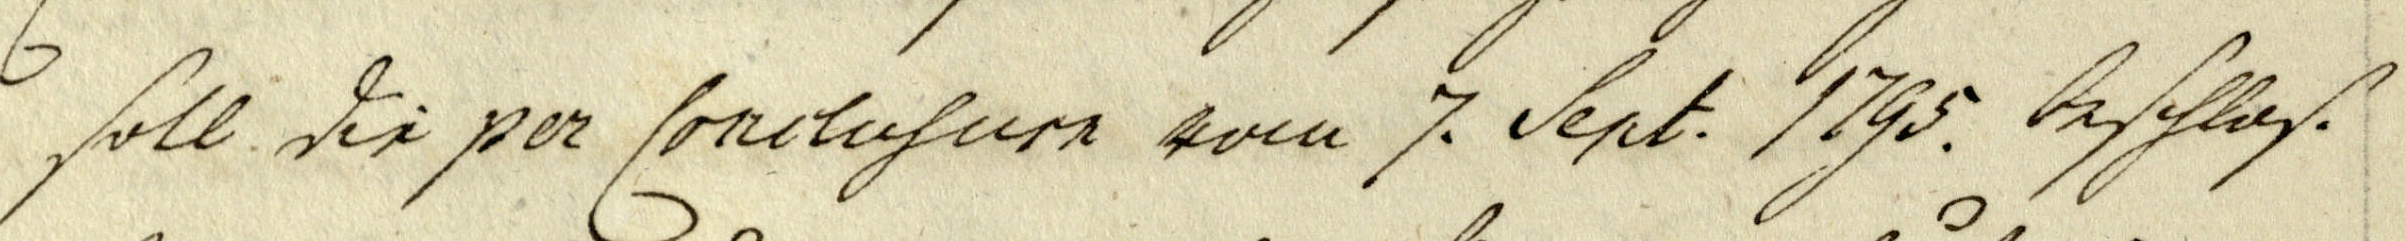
soll die per Conclusum vom 7. Sept. 1795. beschlos¬
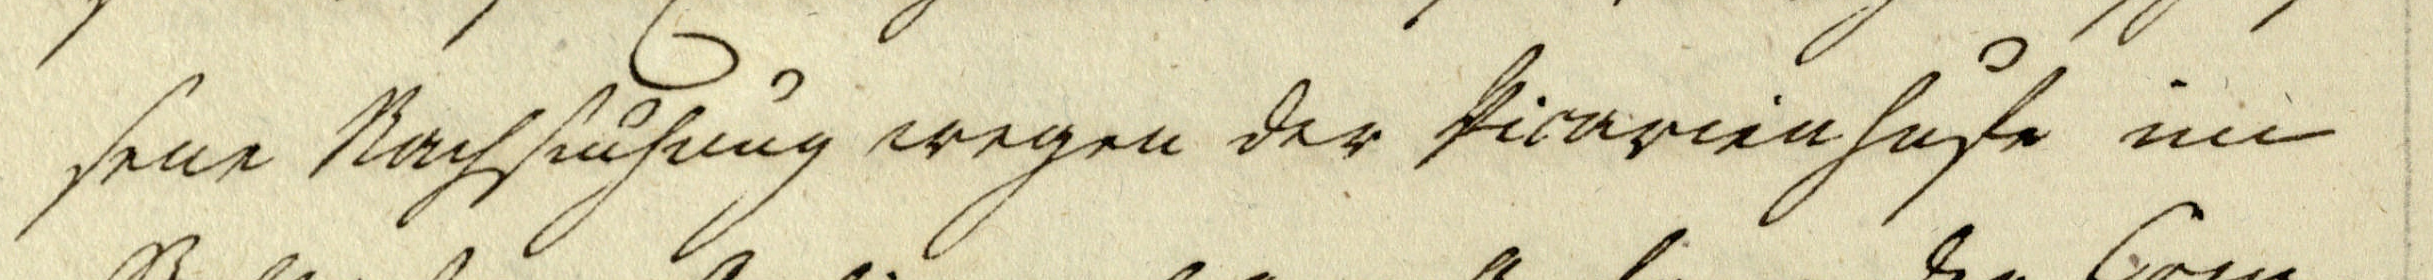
sene Nachsuchung wegen der Vicarienhufe im
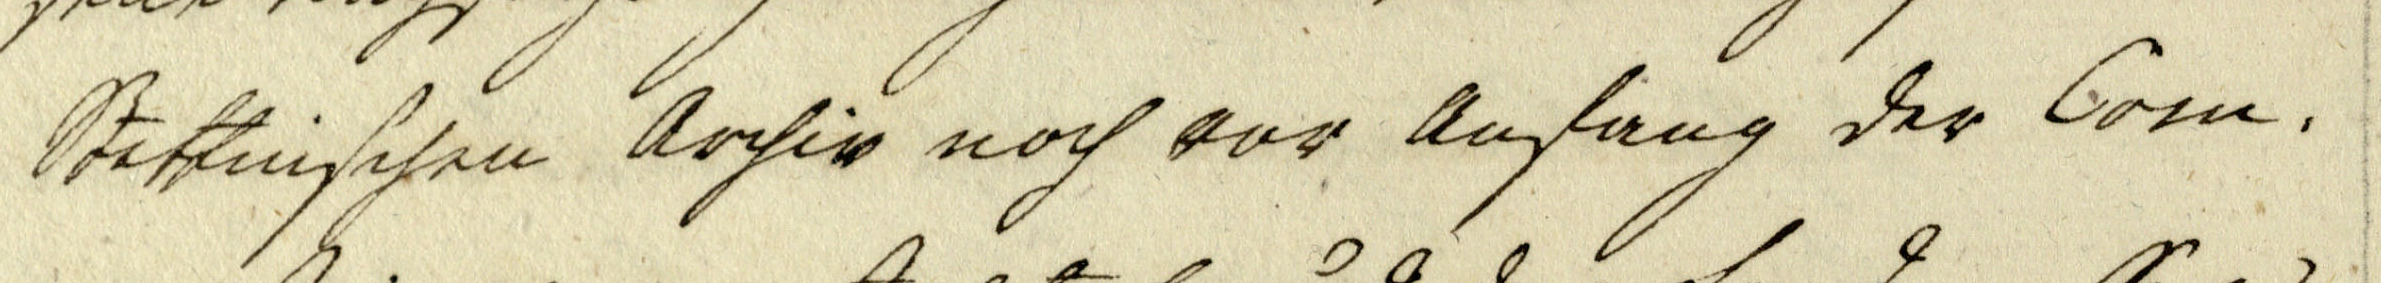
Stettinschen Archiv noch vor Anfang der Com¬
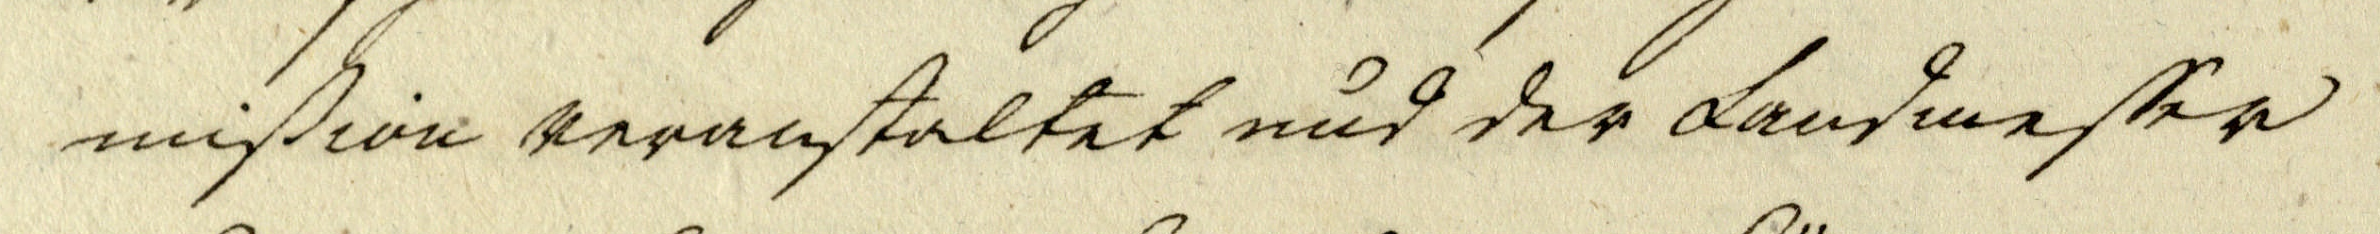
mißion veranstaltet und der Landmesser
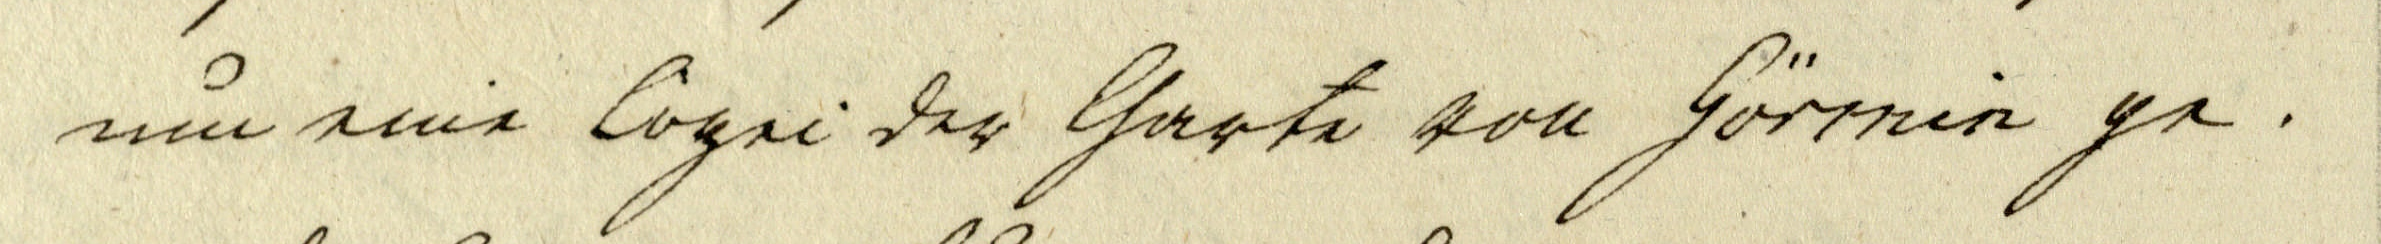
um eine Copei der Charte von Görmin ge¬
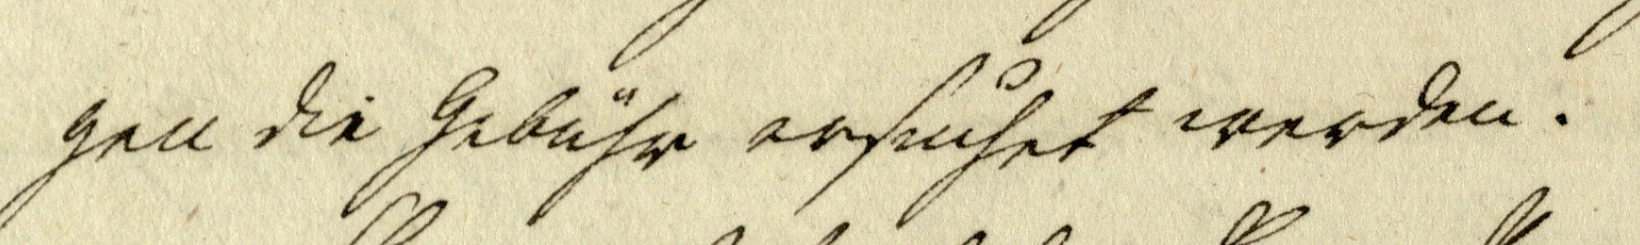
gen die Gebühr ersuchet werden.
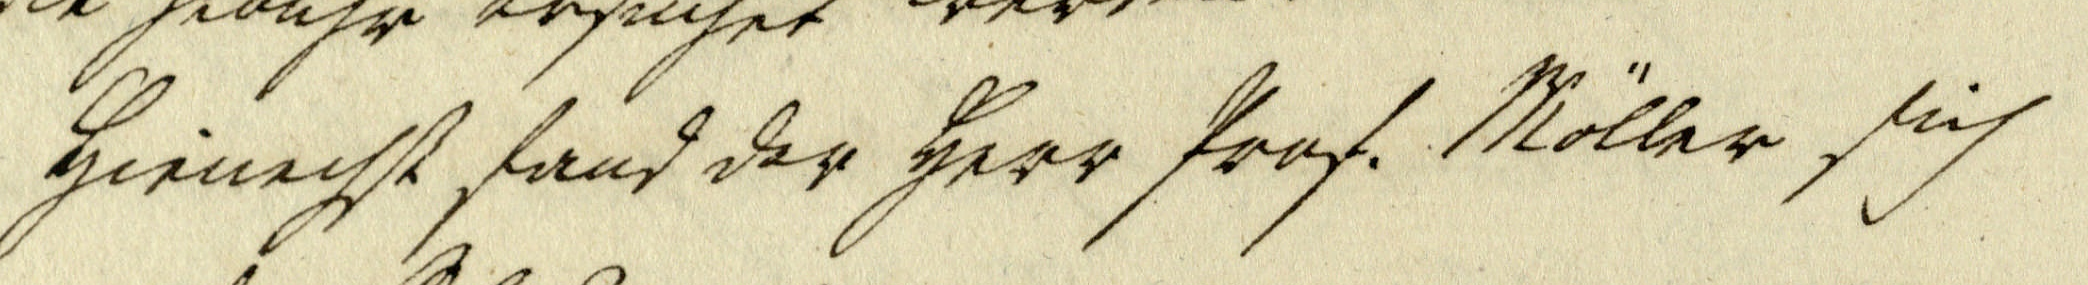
Hienechst fand der Herr Prof. Möller sich
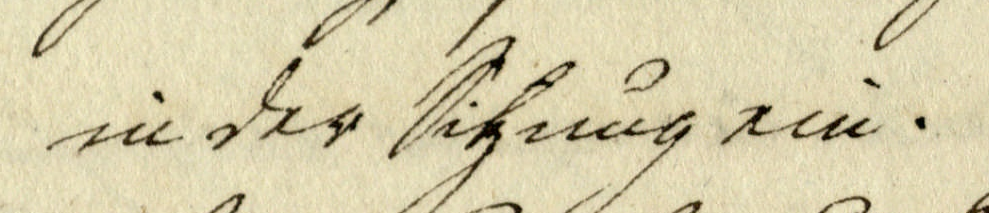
in der Sitzung ein.
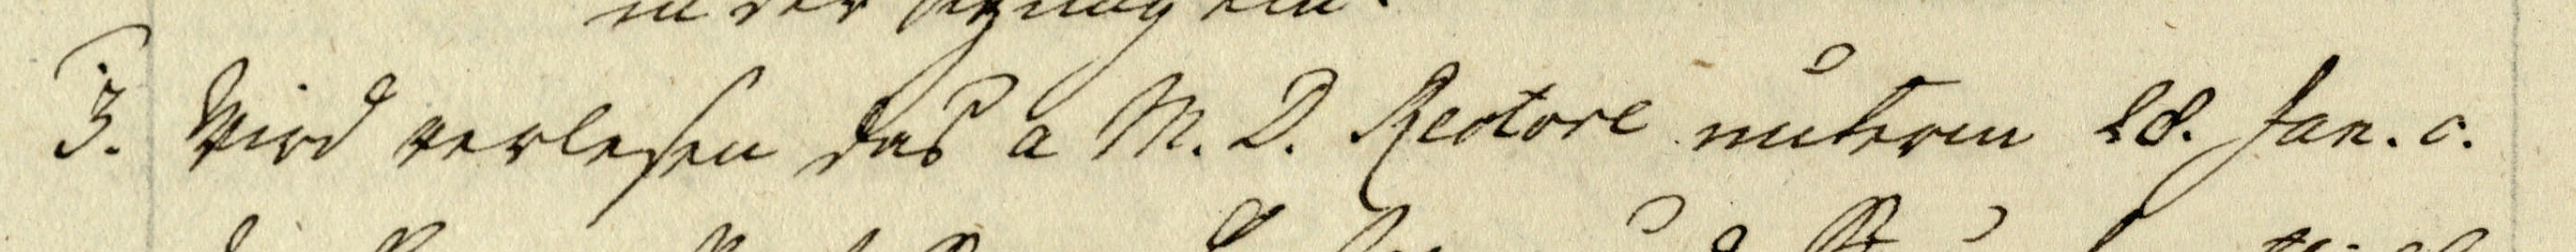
3. Wird verlesen das a M. D. Rectore unterm 28. Jan. c.
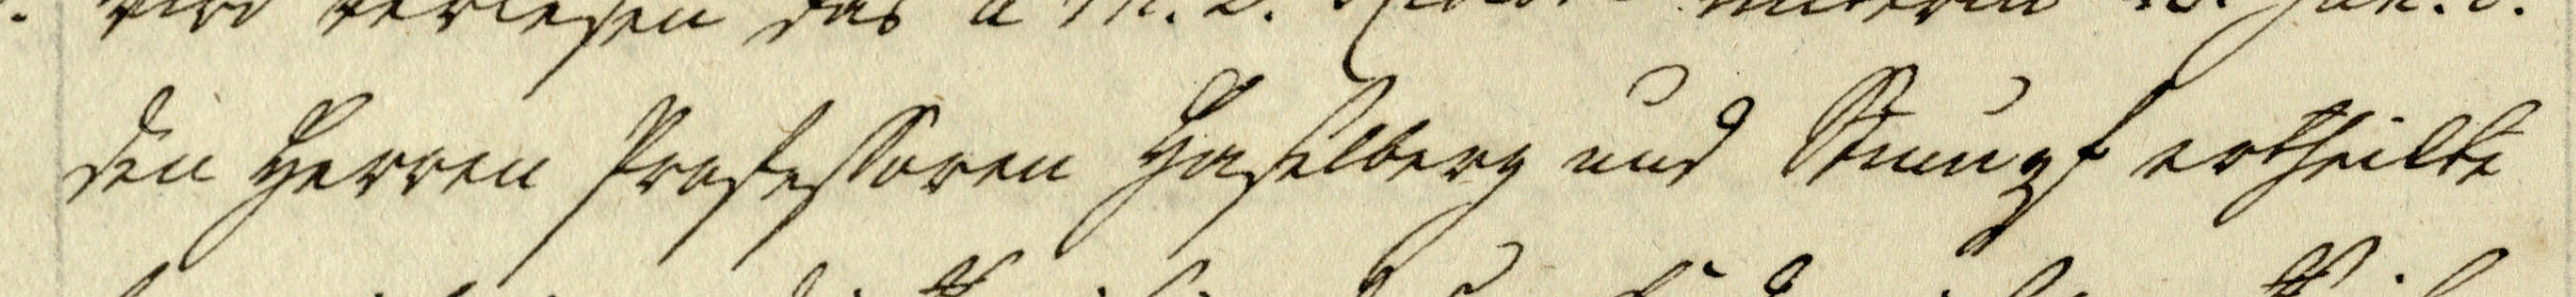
den Herren Professoren Haselberg und Stumpf ertheilte
